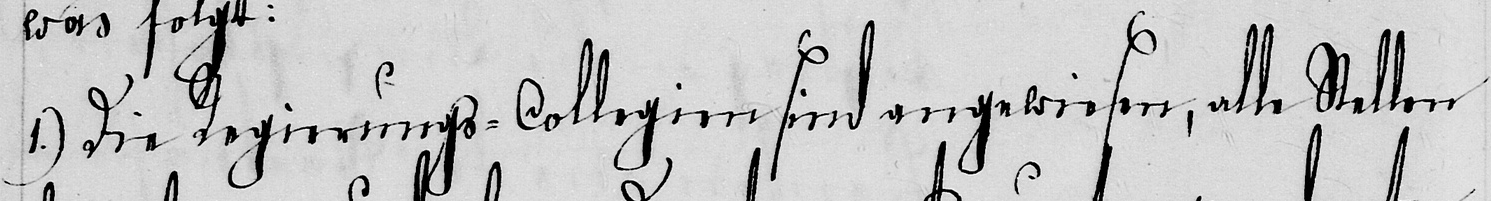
1.) Die Regierungs-Collegien sind angewiesen, alle Stellen
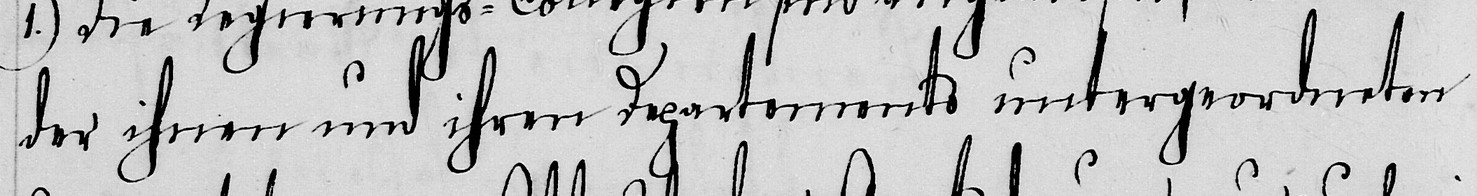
der ihnen und ihren Departements untergeordneten
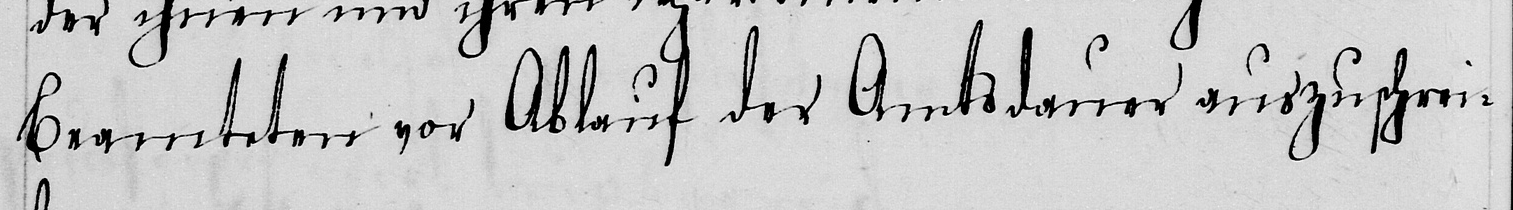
Beamteten vor Ablauf der Amtsdauer auszuschrei¬
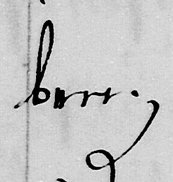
ben.
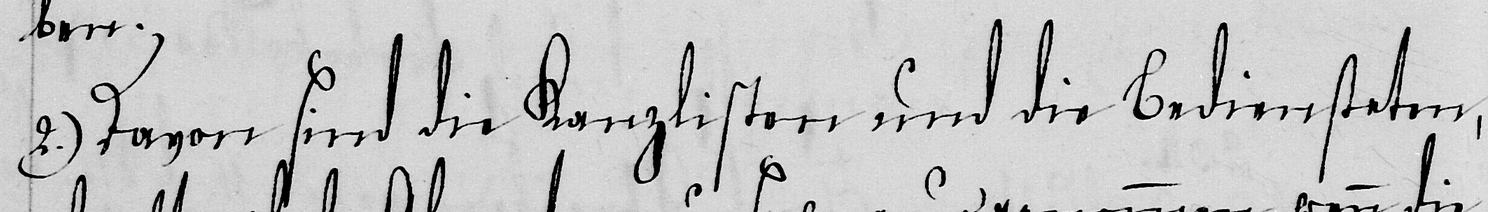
2.) Davon sind die Kanzlisten und die Bediensteten,
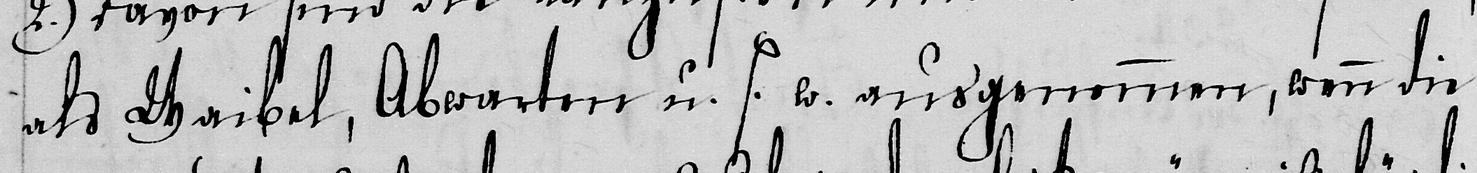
als Waibel, Abwarten u. s. w. ausgenommen, wenn die
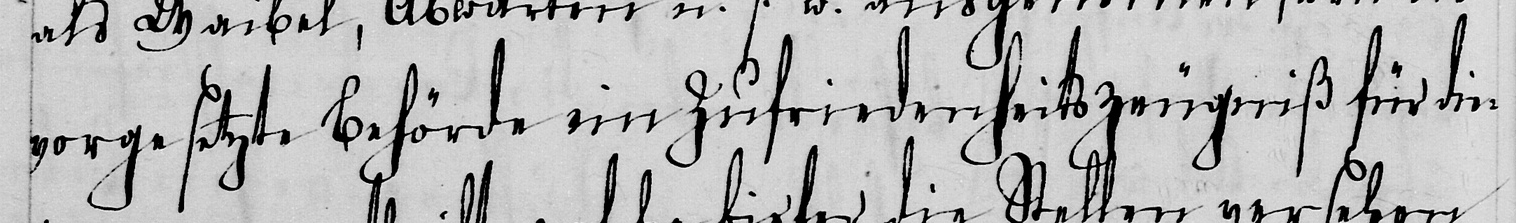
vorgesetzte Behörde ein Zufriedenheitszeugniß für die¬
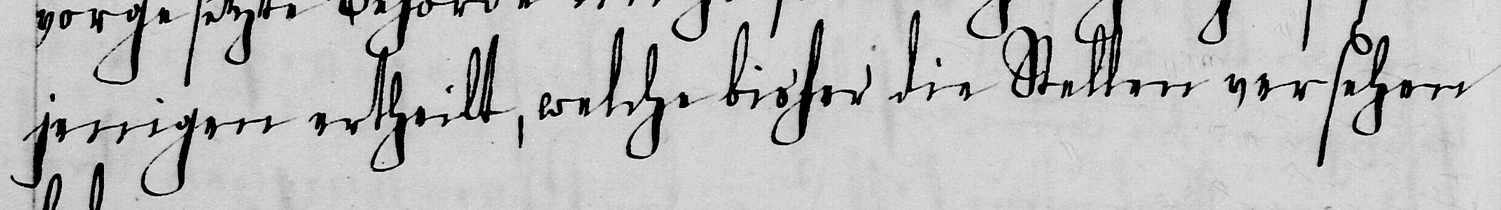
jenigen ertheilt, welche bisher die Stellen versehen
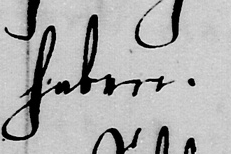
haben.
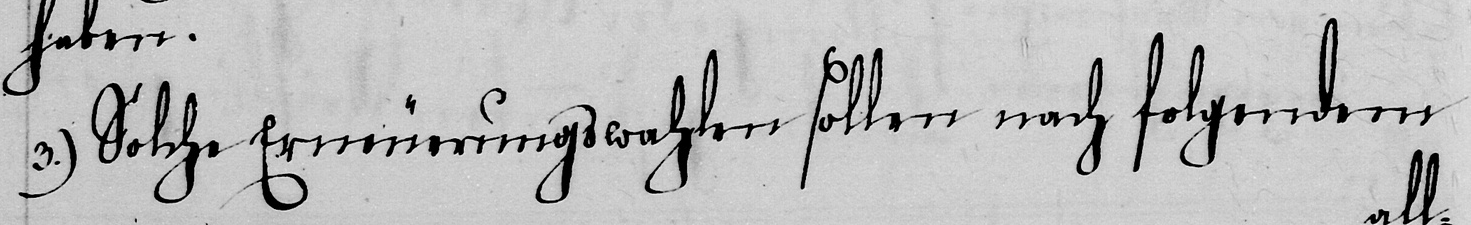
3.) Solche Erneuerungswahlen sollen nach folgendem
